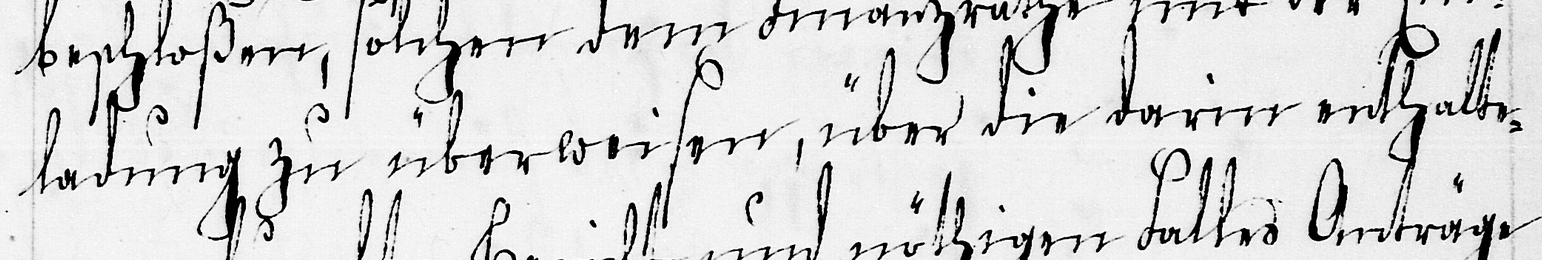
ladung zu überweisen, über die darin enthalte¬
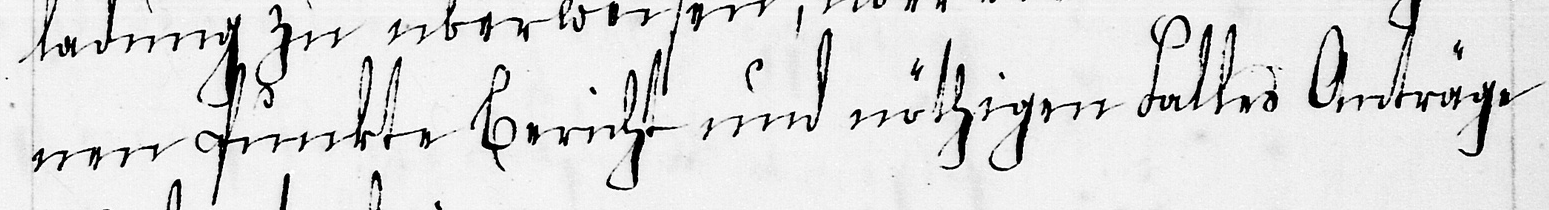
nen Punkte Bericht und nöthigen Falles Anträge
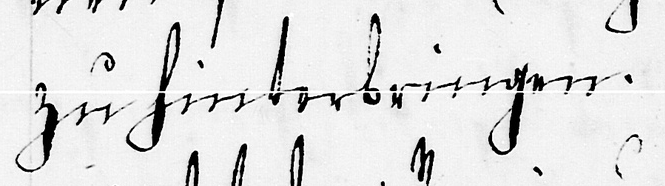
zu hinterbringen.
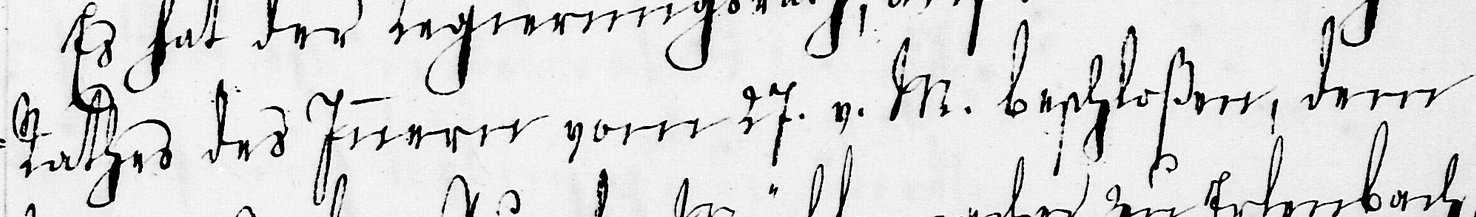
Rathes des Innern vom 27. v. M. beschloßen, dem
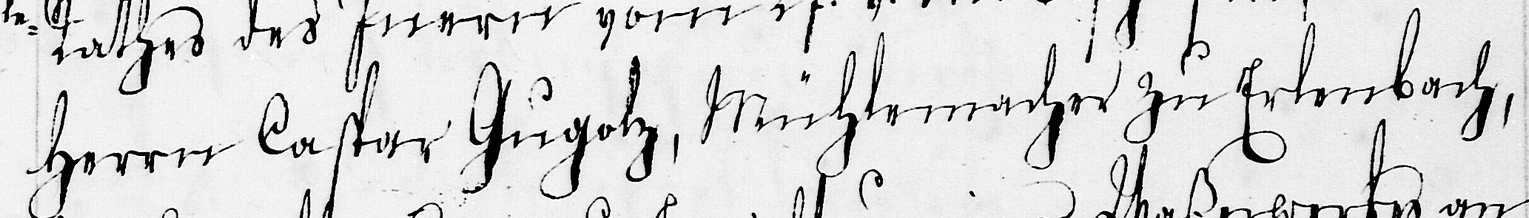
Herrn Caspar Gugolz, Mühlemacher zu Erlenbach,
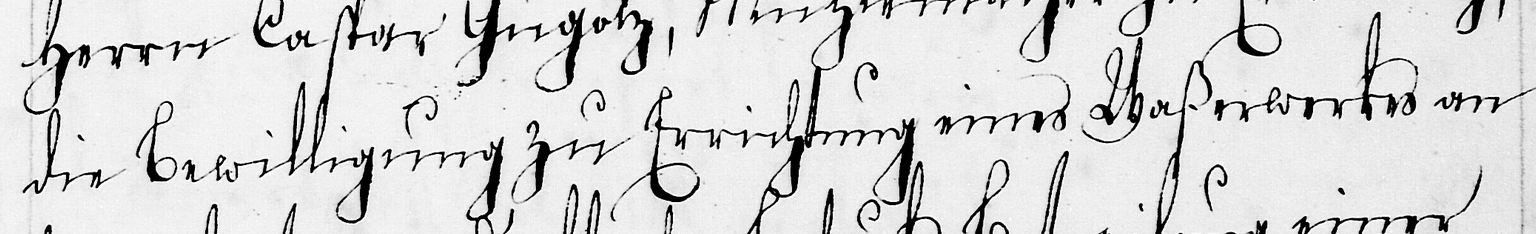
die Bewilligung zu Errichtung eines Waßerwerkes an
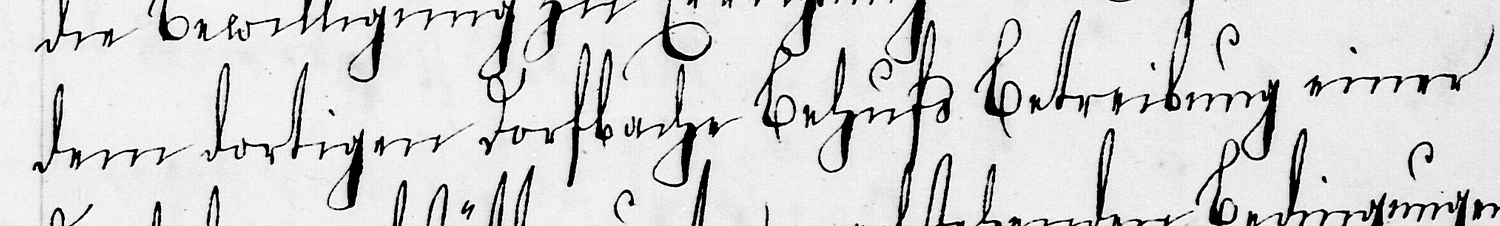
dem dortigen Dorfbache Behufs Betreibung einer
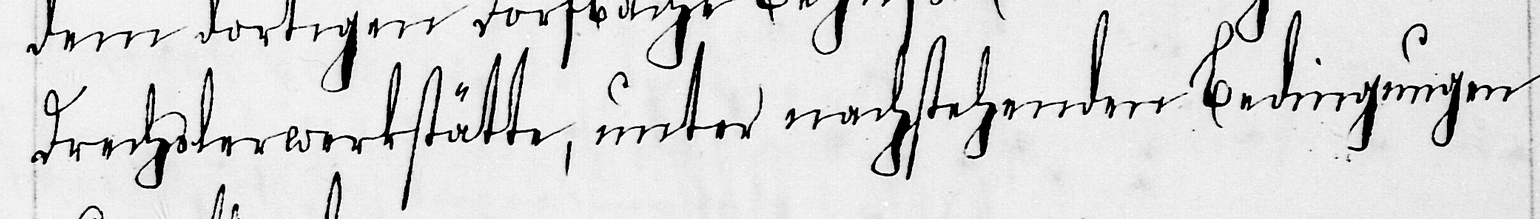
Drechslerwerkstätte, unter nachstehenden Bedingungen
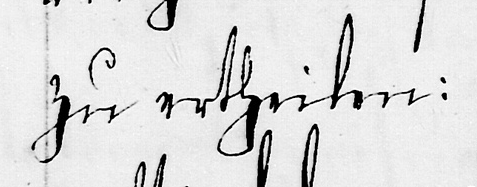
zu ertheilen:
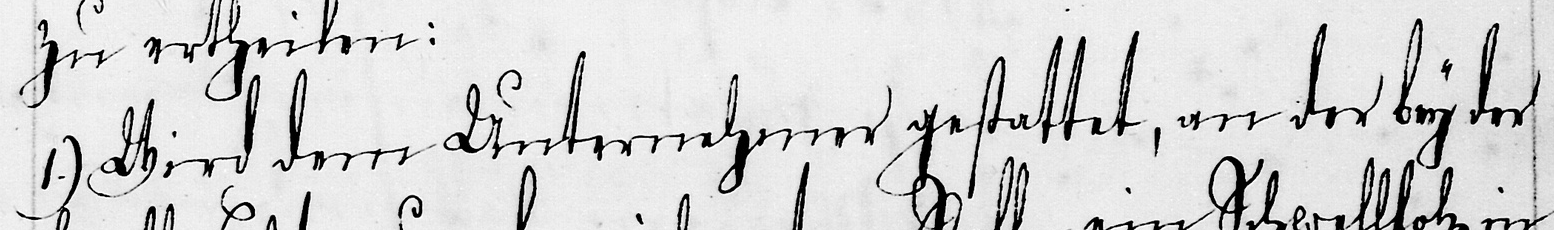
1.) Wird dem Unternehmer gestattet, an der bey der
